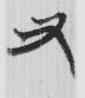又
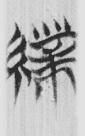{糸帶}
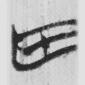甲
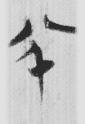{八千}
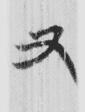又
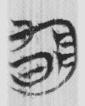昀
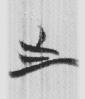之
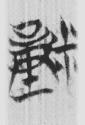糧
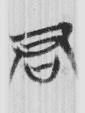君
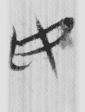女
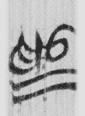爲
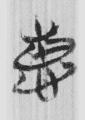惠
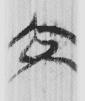交
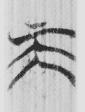天
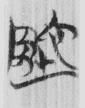地
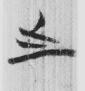之
